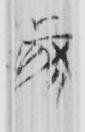戾
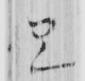巳
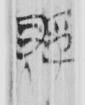{貝孚}
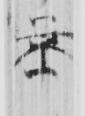不
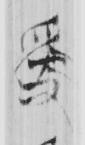{爯心}
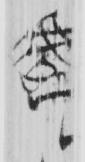唬
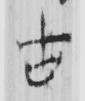古
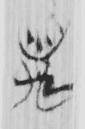萬
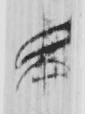民
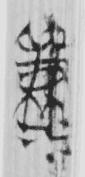溓
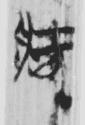{疒方}
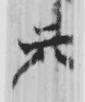亓
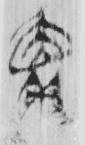{西禾}
